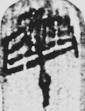兩
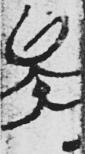矣
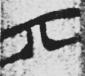亓（其）
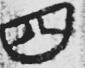四
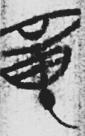章
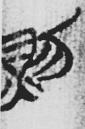則（則）
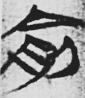俞（喻）
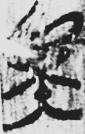矣
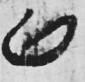㠯（以）
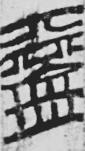○（琴）
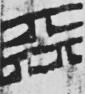○（瑟）
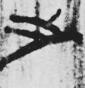之
